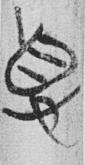惪
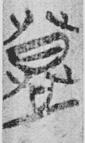登
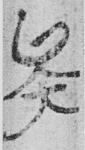矣
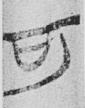可（何）
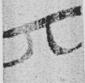亓（其）
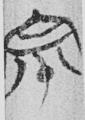宗（崇）
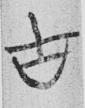古（故）
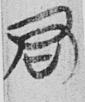君
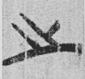之
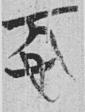○（愿）
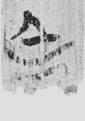良
